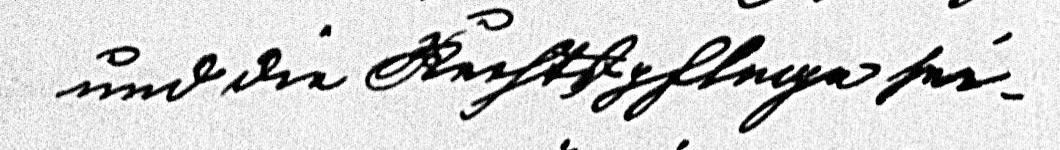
und die Rechtspflege sei¬
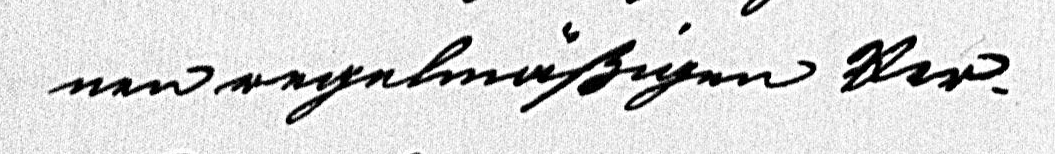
nen regelmäßigen Ver¬
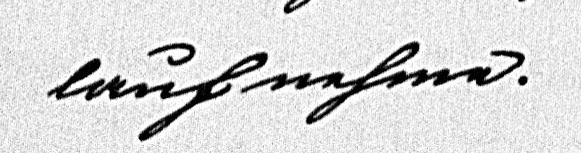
lauf nehme.
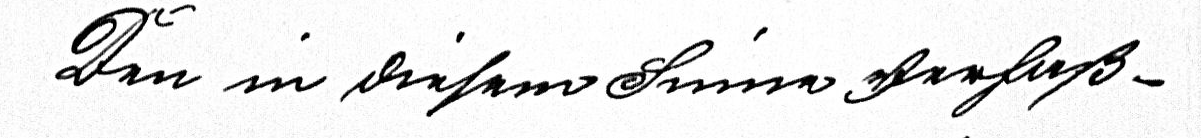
Den in diesem Sinne verfaß¬
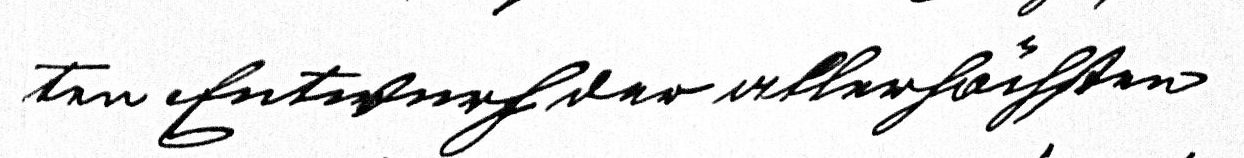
ten Entwurf der allerhöchsten
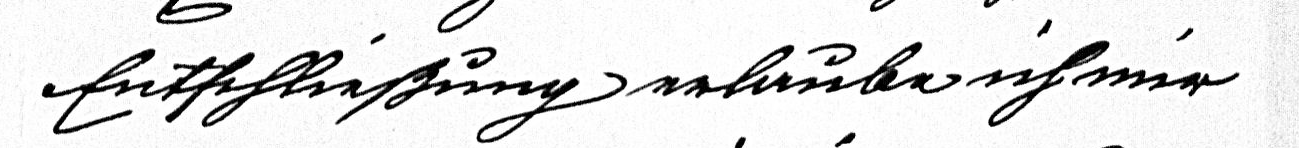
Entschließung erlaube ich mir
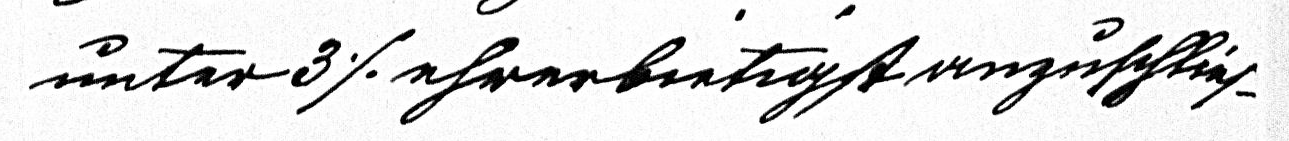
unter 3 ./. ehrerbietigst anzuschies¬
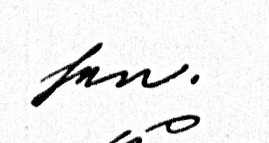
sen.
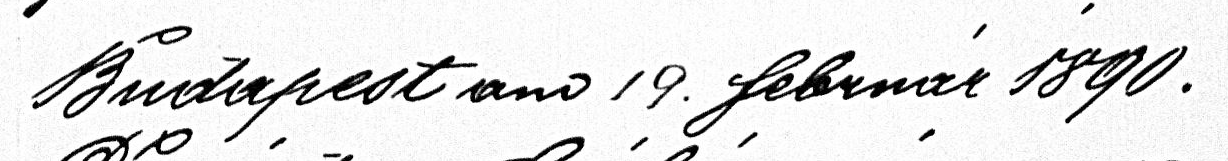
Budapest am 19. Február 1890.
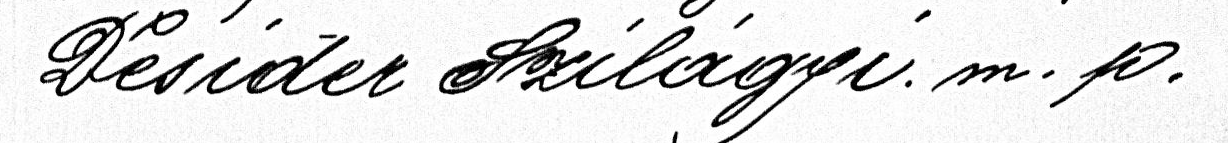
Desider Szilágyi. m. p.
